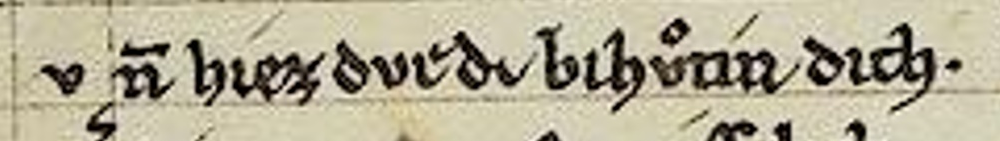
Vn(d) hiez dvr d(az) bihv°otin dich.
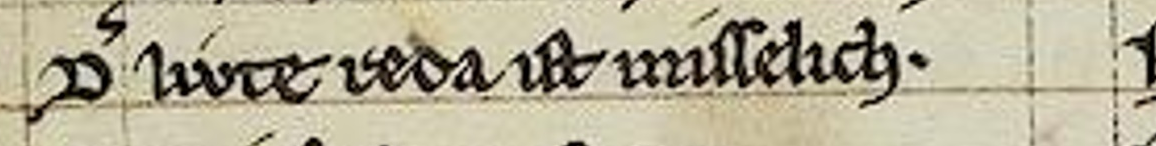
D(er) livte reda iſt miſſelich.
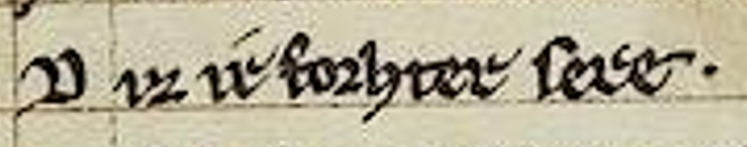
Diz ir forhter ſere.
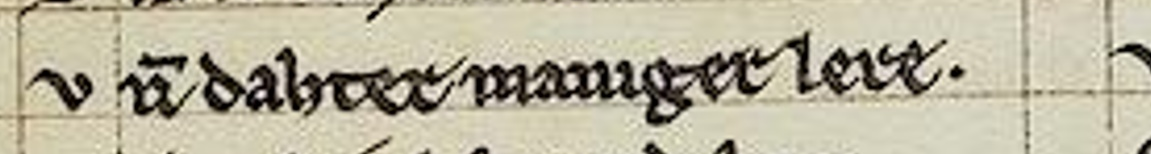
Vn(d) dahter maniger lere.
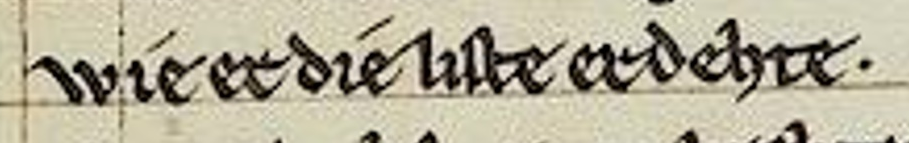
Wie er die liſte erdehte.
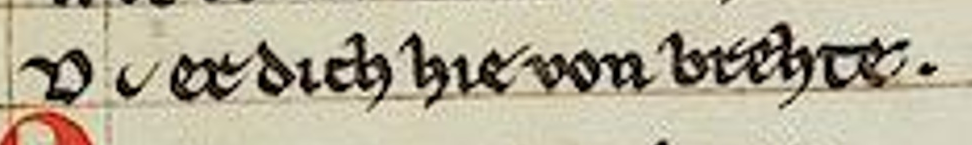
D(az) er dich hie von brehte.
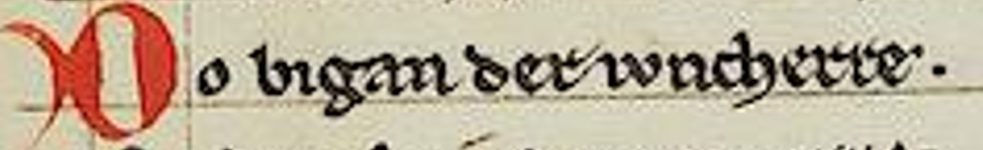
*Do bigan der ivncherre.
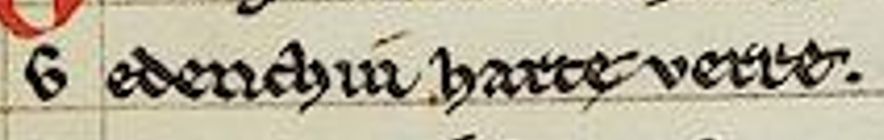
Gedenchin harte verre.
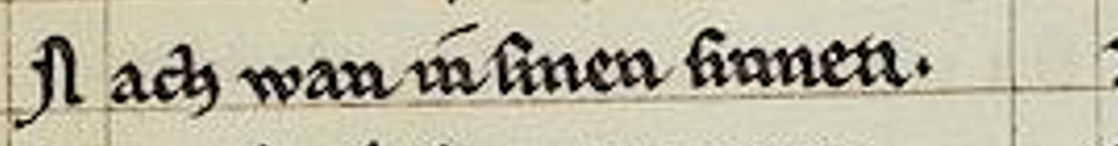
Nach wan in ſinen ſinnen.
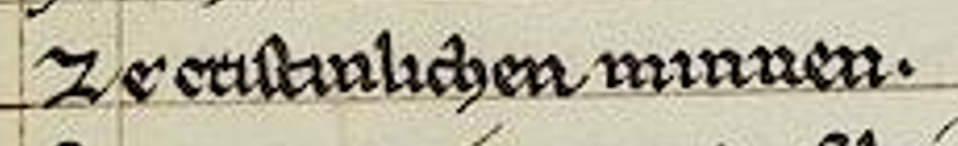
Ze criſtinlichen minnen.
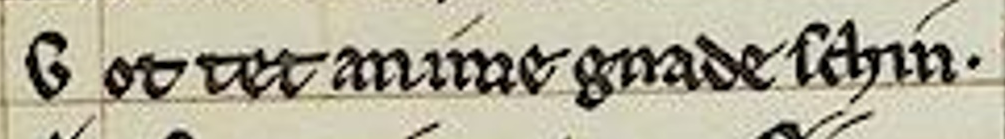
Got tet an ime gnade ſchin.
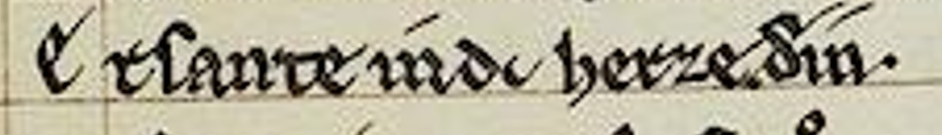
Erſante in d(az) herze Sin.
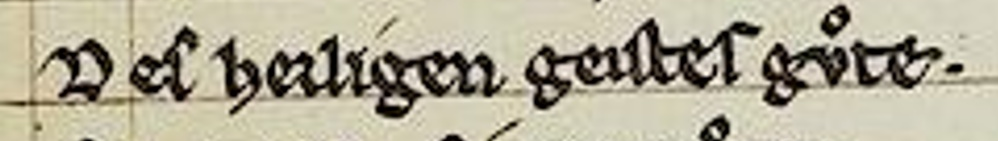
Deſ heiligen geiſteſ gv°ote.
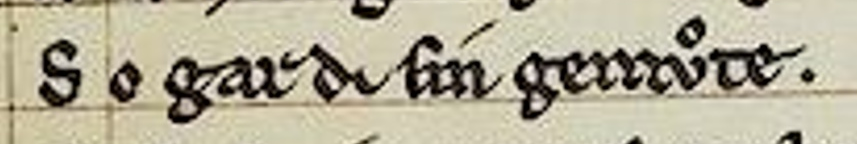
So gar d(az) ſin gemv°ote.
